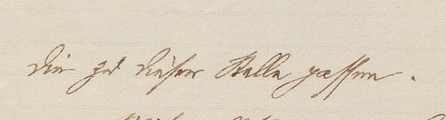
die zu dieser Stelle passen.
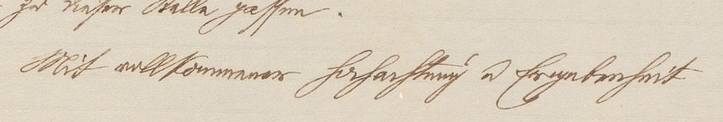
Mit vollkommener Hochachtung u Ergebenheit
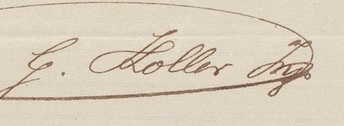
G. Koller Ing
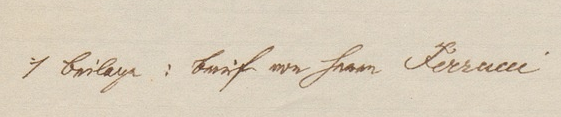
1 Beilage: Brief von Herrn Ferrucci
